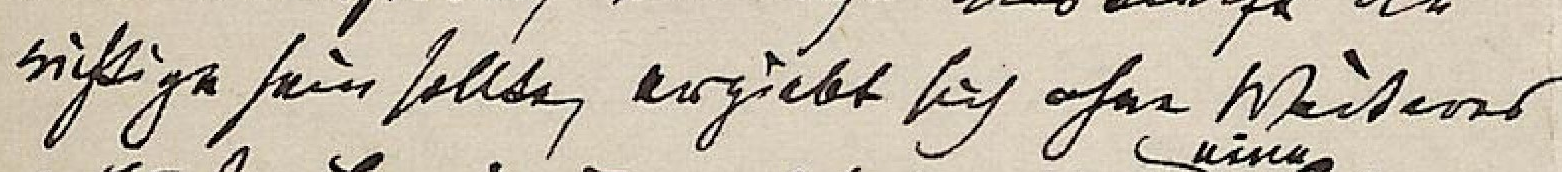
richtige sein sollte, ergiebt sich ohne Weiteres
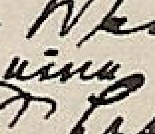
eine
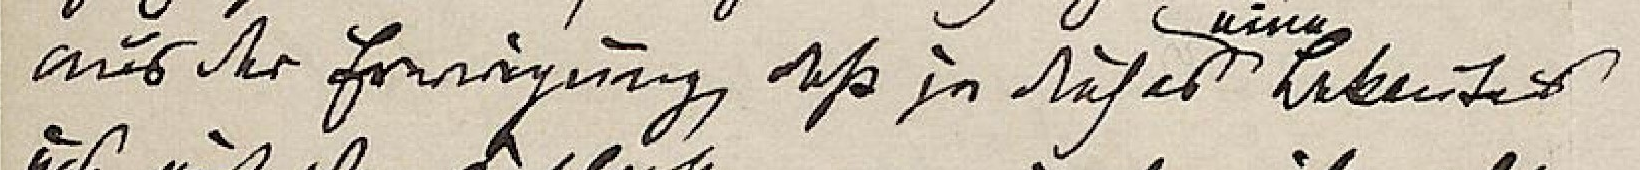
aus der Erwägung, daß ja dieses Bekentnis
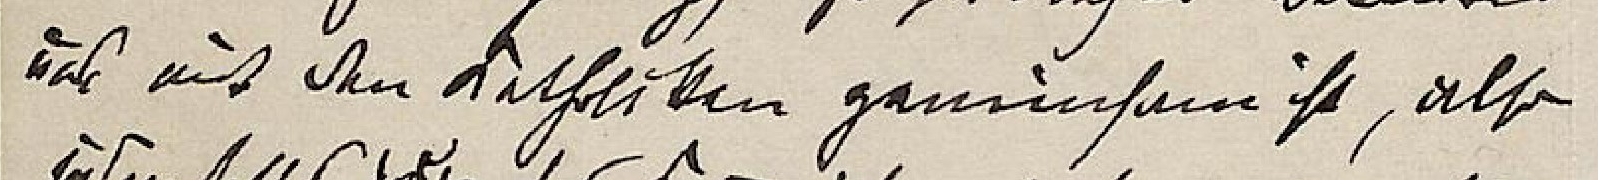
uns mit den Katholiken gemeinsam ist, also
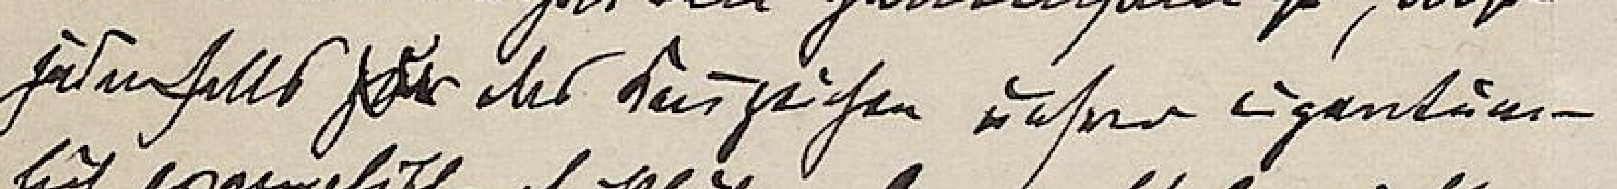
jedenfalls ja das Kenzeichen unsrer eigentüm¬
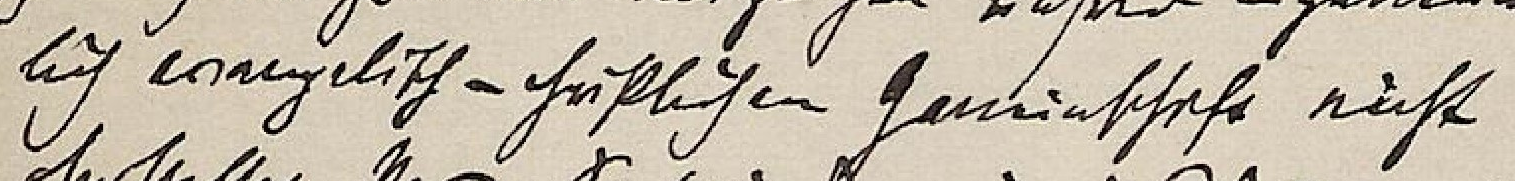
lich evangelisch-christlichen Gemeinschaft nicht
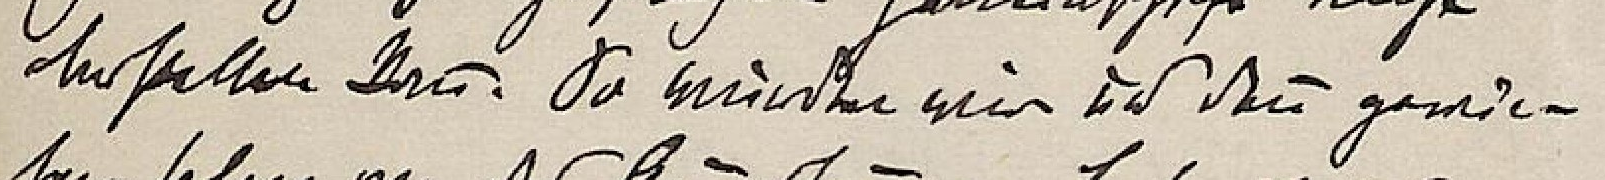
herstellen kann. So würden wir uns den gemein¬
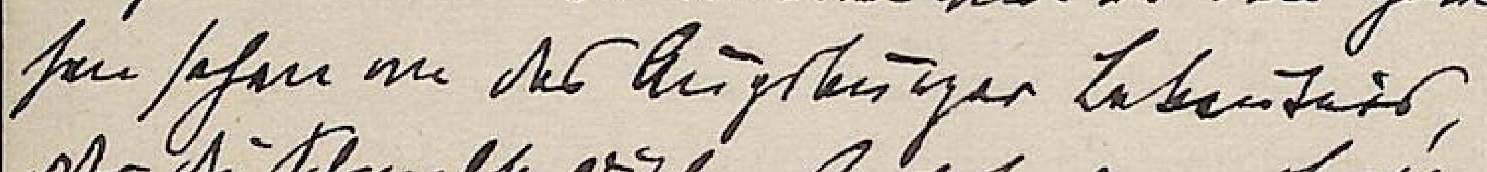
sam sehen an das Augsburger Bekenntnis,
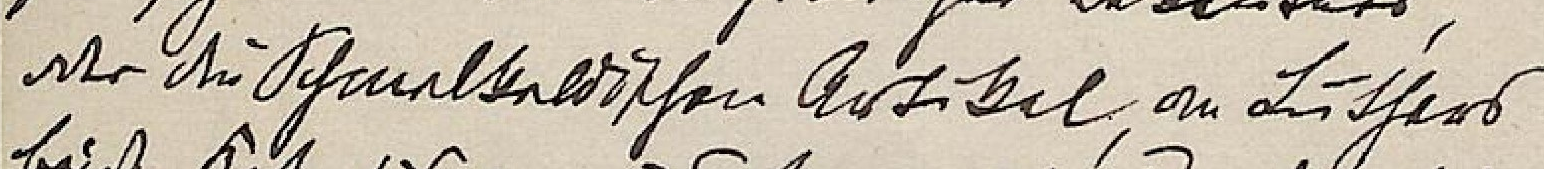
oder die Schmalkaldischen Artikel, an Luthers
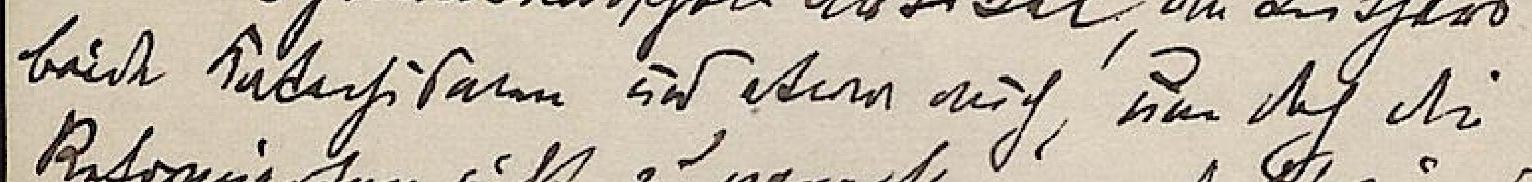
beide Katechismen und etwa auch, um doch die
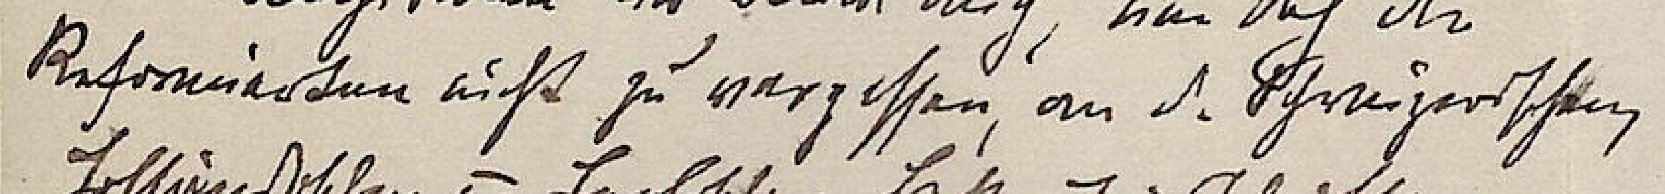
Reformierten nicht zu vergessen an d. Schweizerischen,
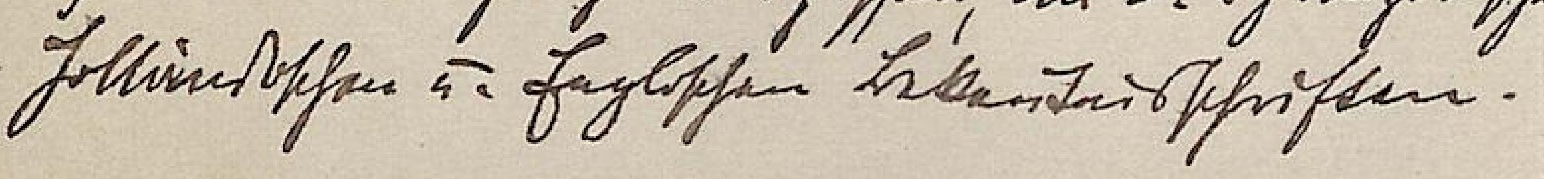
Holländischen u. Englischen Bekentnisschriften.
